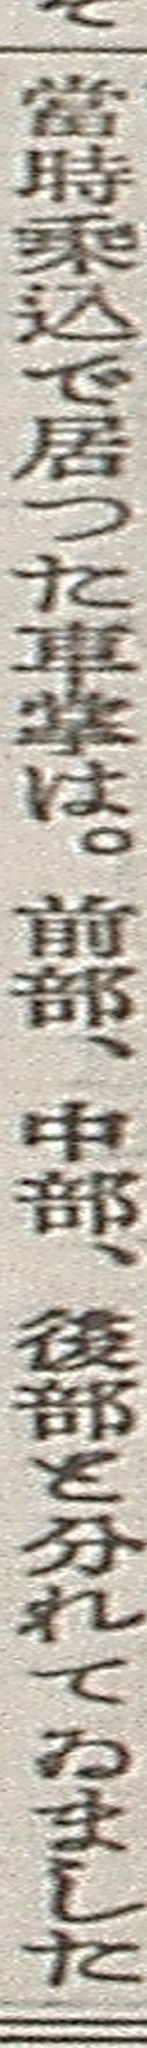当時乗込で居つた車掌は。前部、中部、後部と分れてゐました
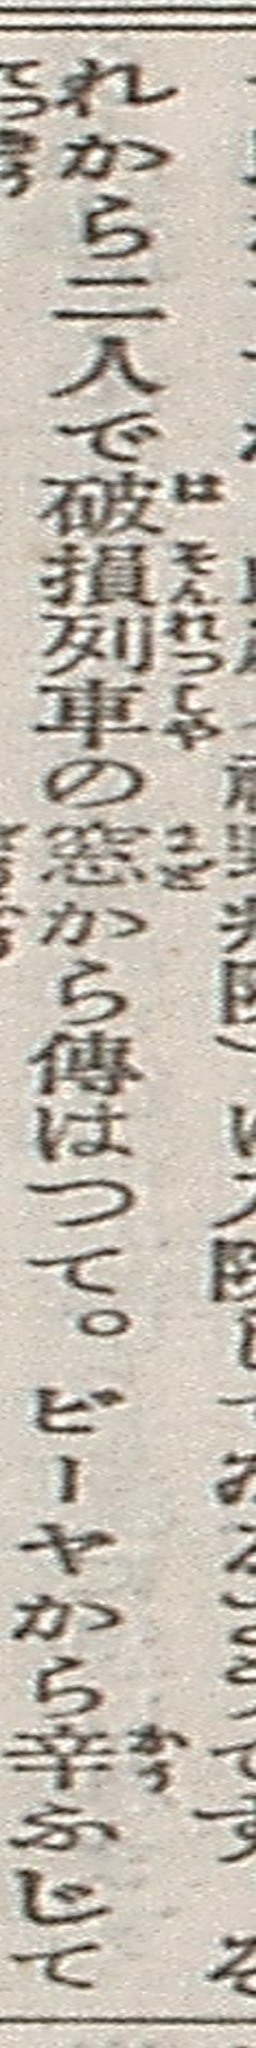れから二人で破損列車の窓から伝はつて。ビーヤから辛ふじて
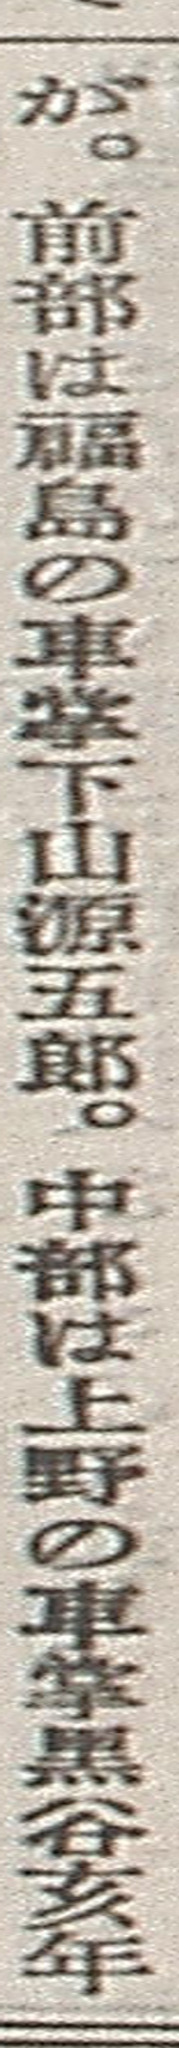が。前部は福島の車掌下山源五郎。中部は上野の車掌黒谷亥年
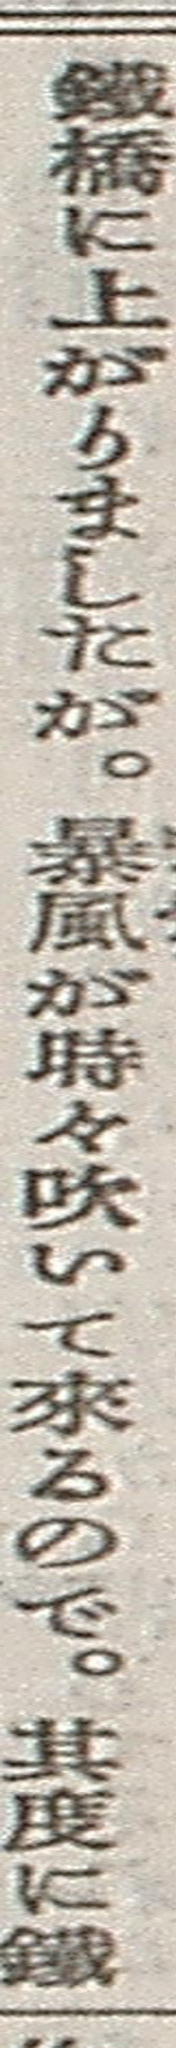鉄橋に上がりましたが。暴風が時々吹いて来るので。其度に鉄
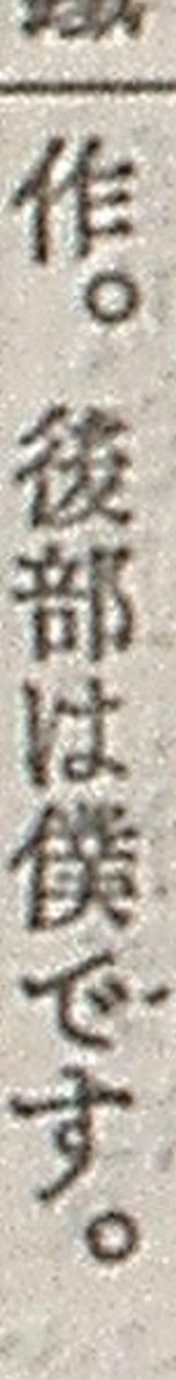作。後部は僕です。

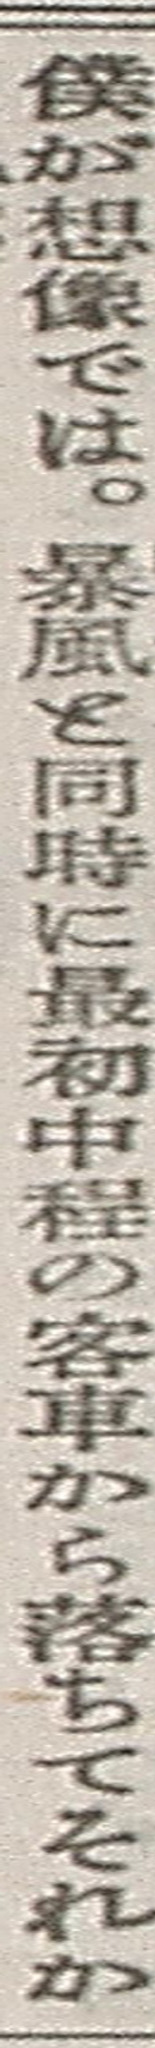僕が想像では。暴風と同時に最初中程の客車から落ちてそれか
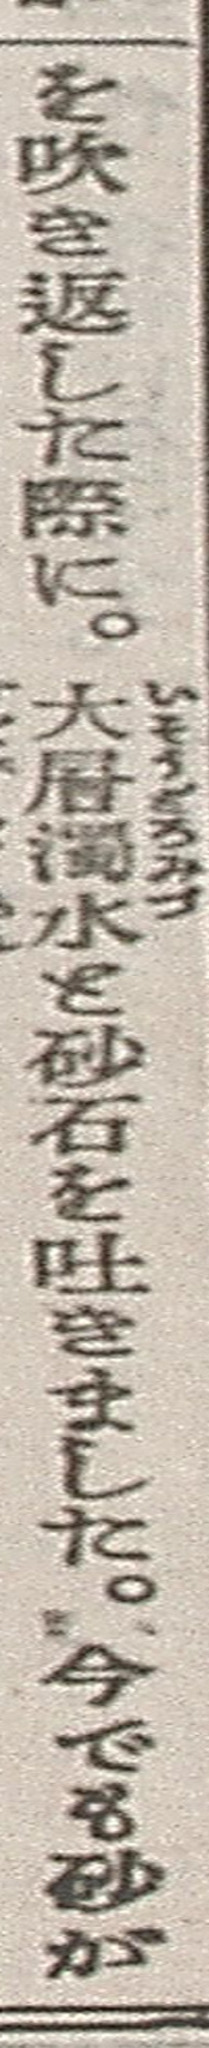を吹き返した際に。大層濁水と砂土を吐きました。今でも砂が
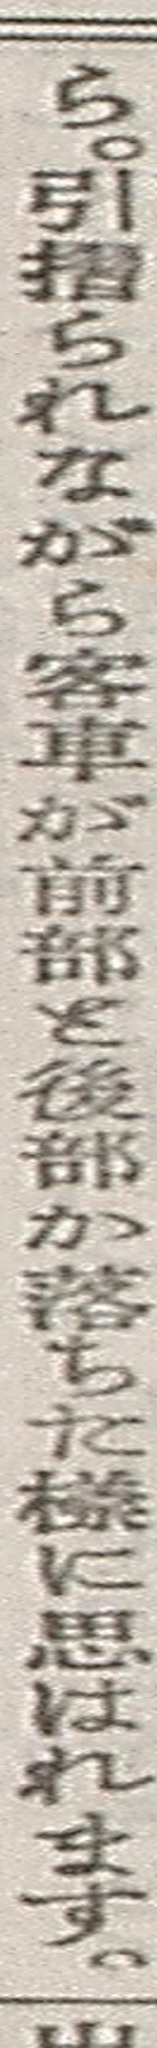ら。引摺られながら客車が前部と後部か落ちた様に思はれます。
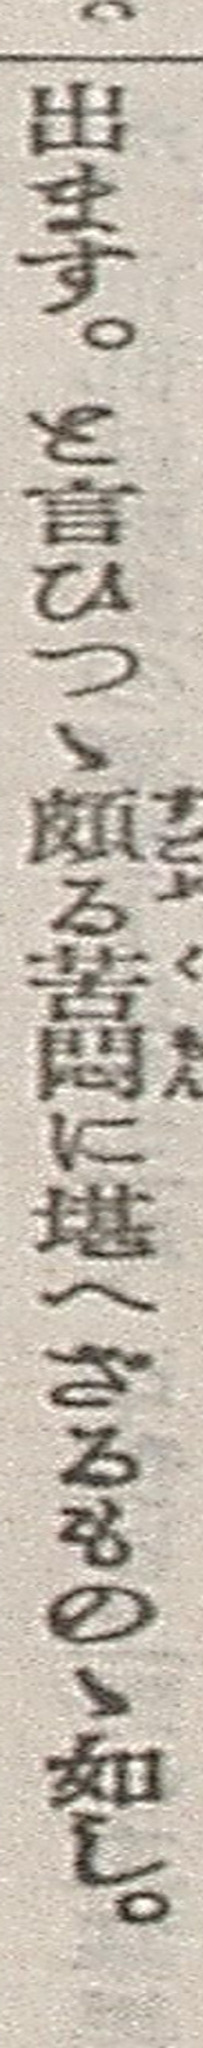出ます。と言ひつゝ頗る苦悶に堪へざるものゝ如し。
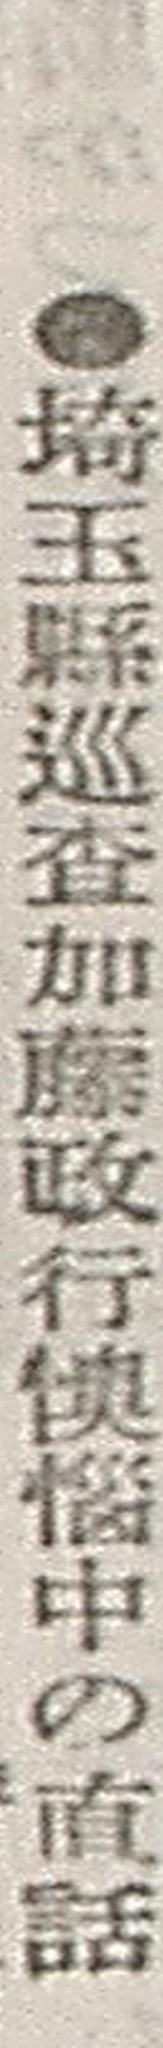●埼玉県巡査加藤政行懊悩中の直話
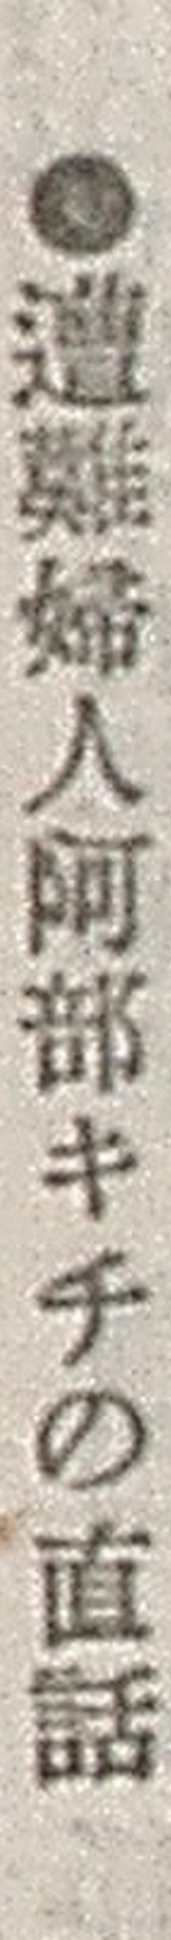●遭難婦人阿部キチの直話
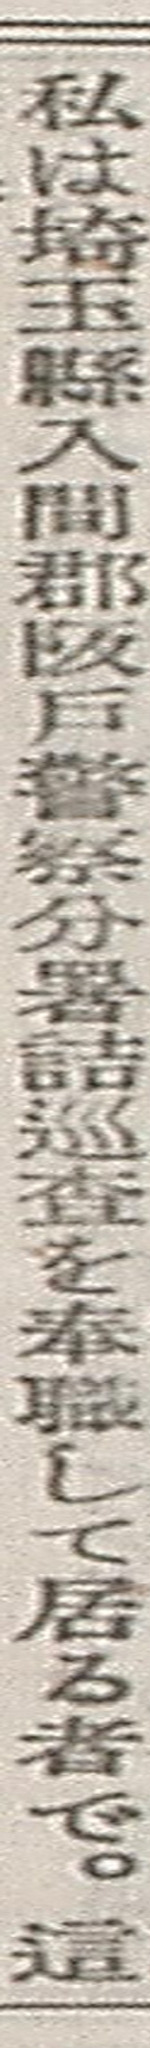私は埼玉県入間郡阪戸警察分署詰巡査を奉職して居る者で。這
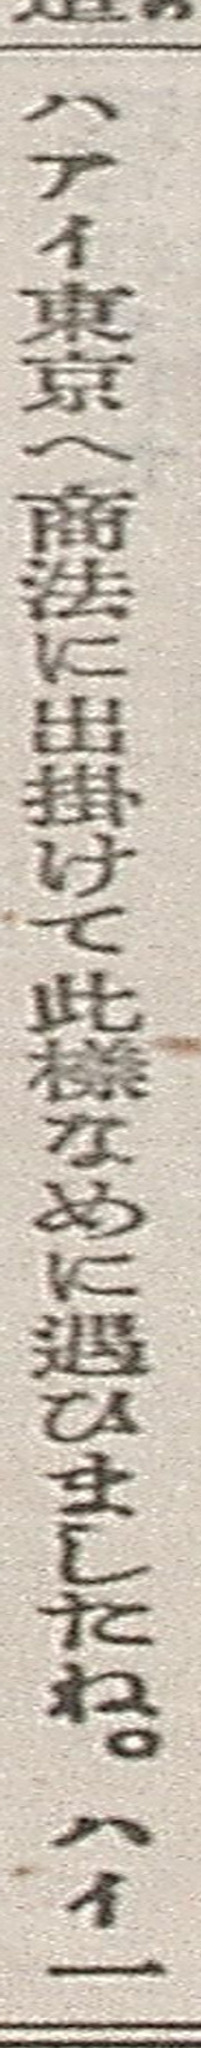ハアイ東京へ商法に出掛けて此様なめに遭ひましたね。ハイ一
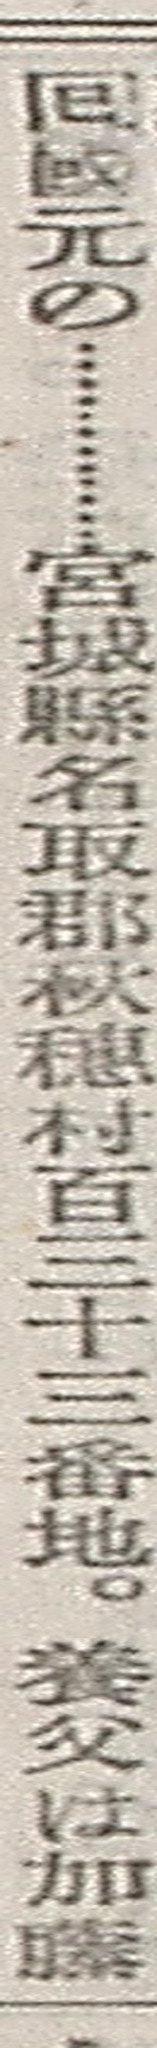回国元の………宮城県名取郡秋穂村百三十三番地。養父は加藤
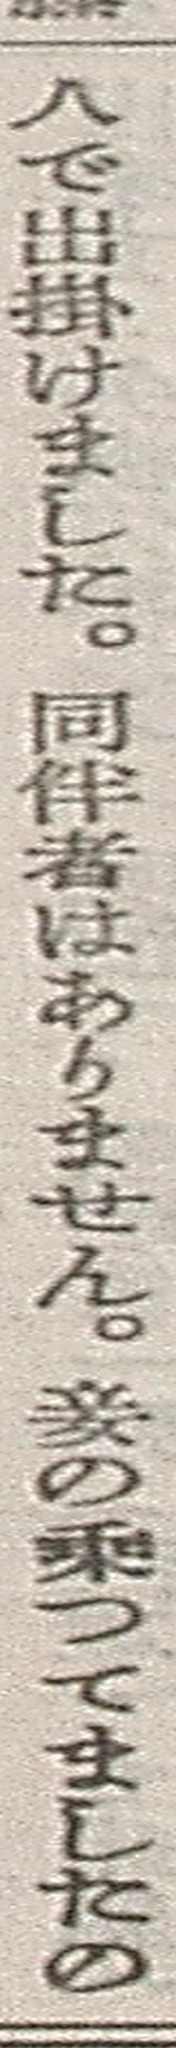人で出掛けました。同伴者はありません。妾の乗つてましたの
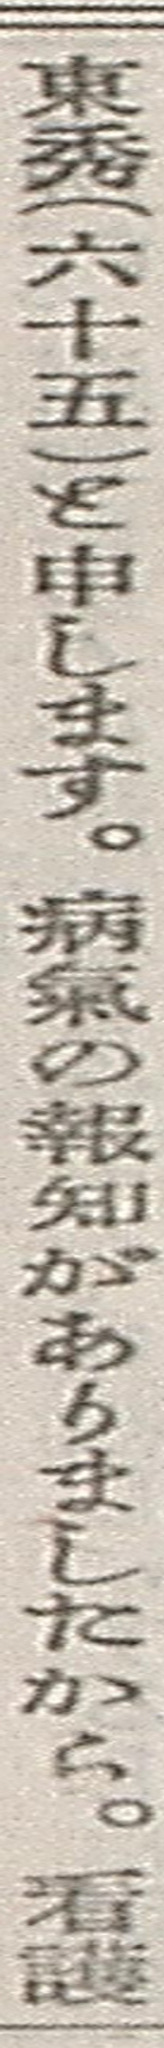東秀と申します。病気の報知がありましたから。看護
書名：風俗畫報臨時増刊第百九十九號　明治三十二年十月各地災害圖會（前編之續）
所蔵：東京大学地震研究所図書室 Earthquake Research Institute Library, The University of Tokyo, JAPAN
